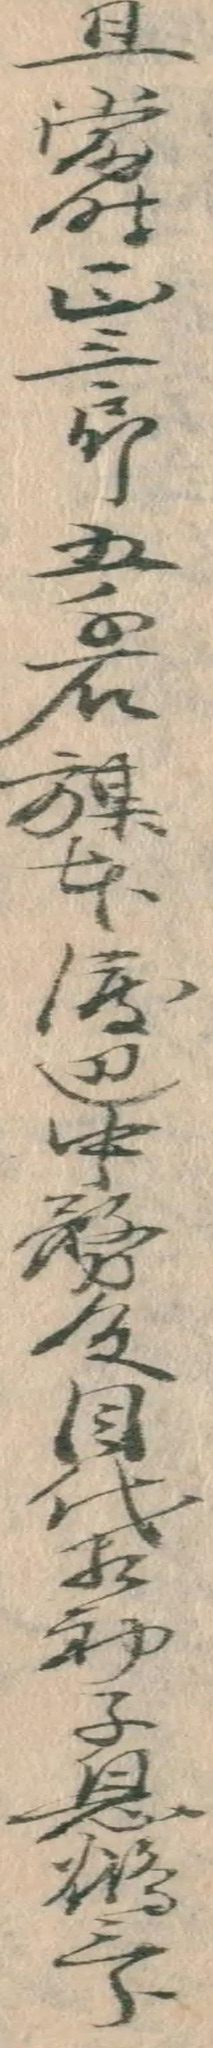且當時正三郎五千石旗本渡辺中務殿目代相勤子息鶴三郎
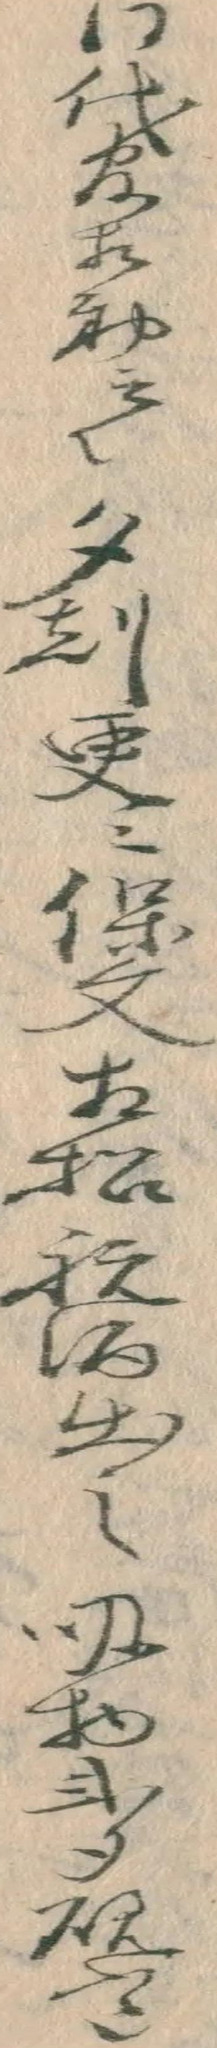同代官相勤云々夕刻更ニ保文相招祝酒出之吸物弐〆硯ふた
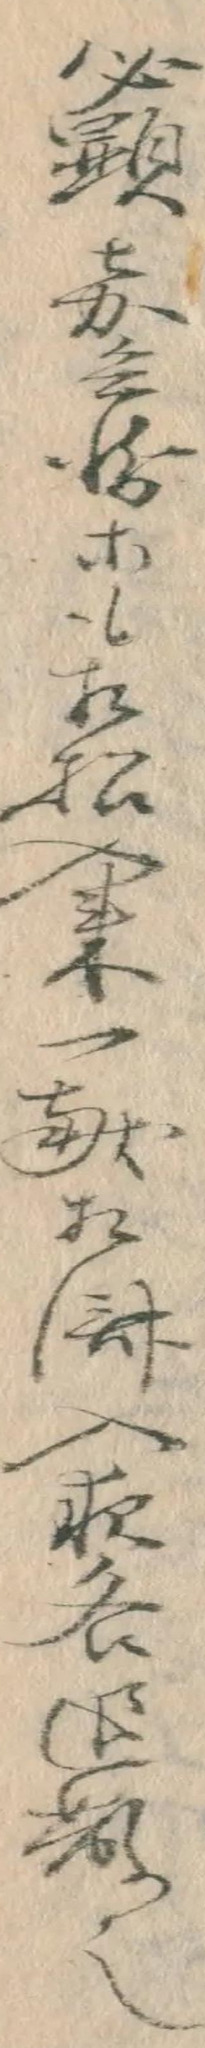必顕嘉兵衛等も相招入来一献相済入夜各退散也
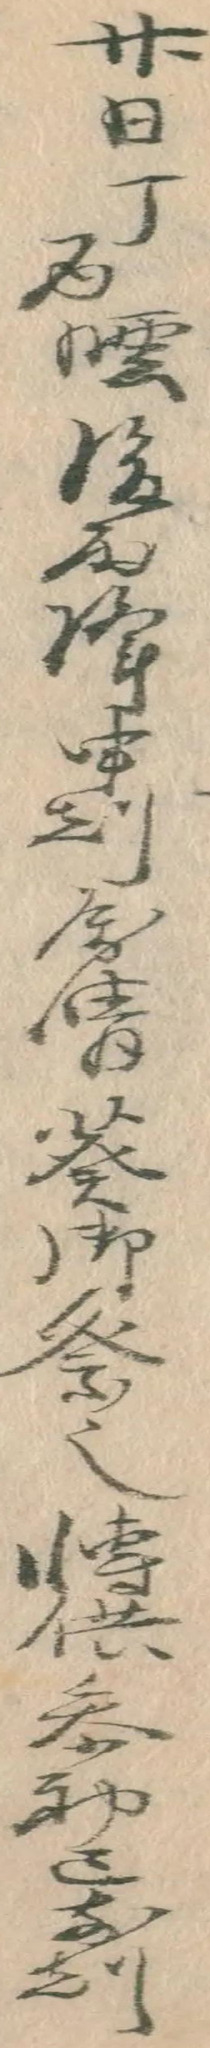廿日丁酉晴後雨降申刻属晴葵御祭也轉供参勤巳前刻
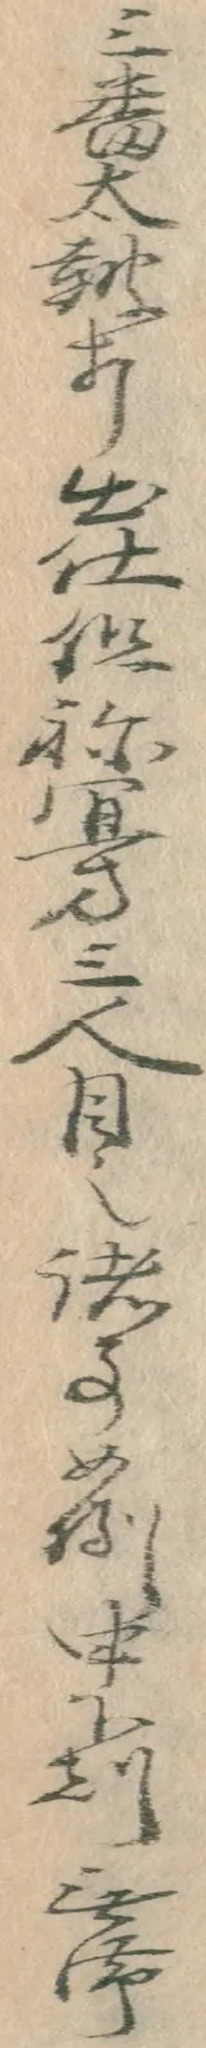三番太鼓打出仕祢宜方三人目也諸事如例申下刻無滞

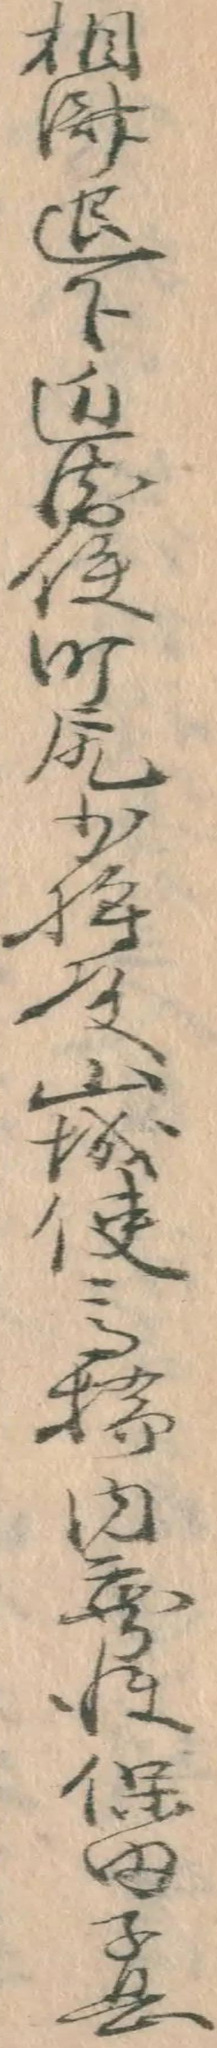相済退下近衛使町尻少将殿山城使高橋内蔵使保田子息
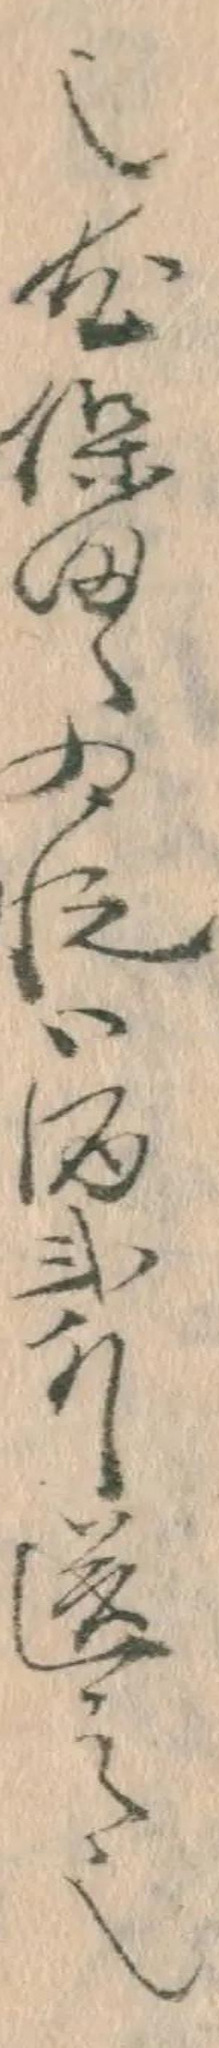也尤保田へ為祝御酒弐升送之也
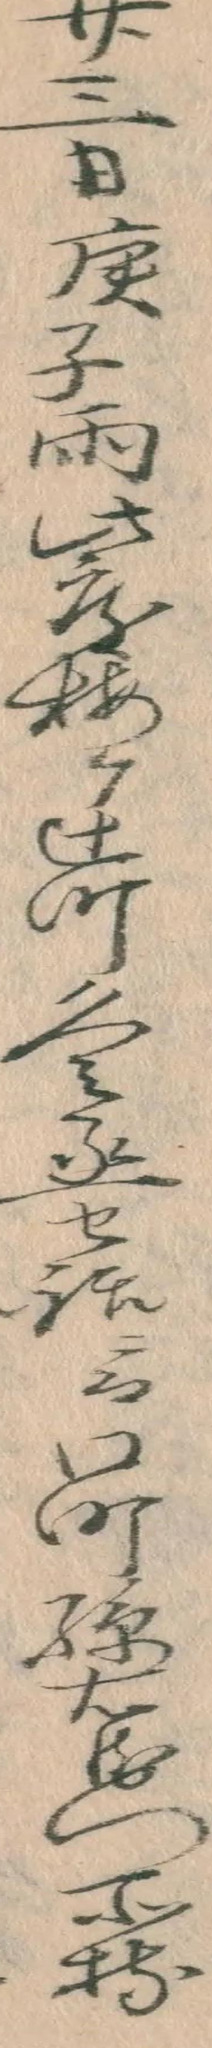廿三日庚子雨此度梅ケ辻町久之丞世話ニ而口町孫右衛門所持
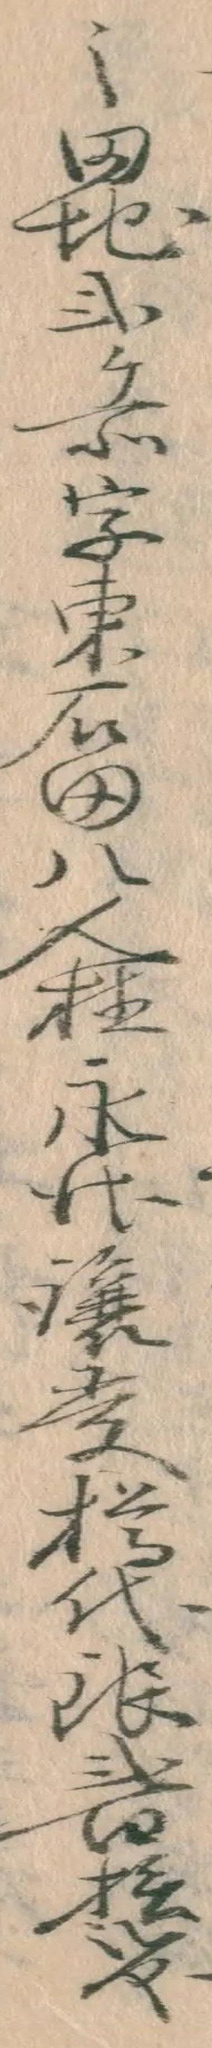之田地弐ケ所字東石田八人植永代譲受樽代銀弐百拾弐匁
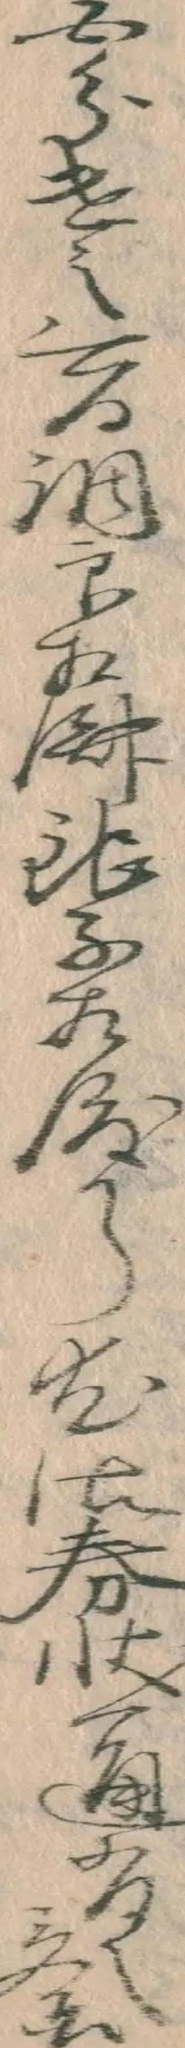五分遣之今日調印相済銀子相渡了尤沽券状一通有之受取
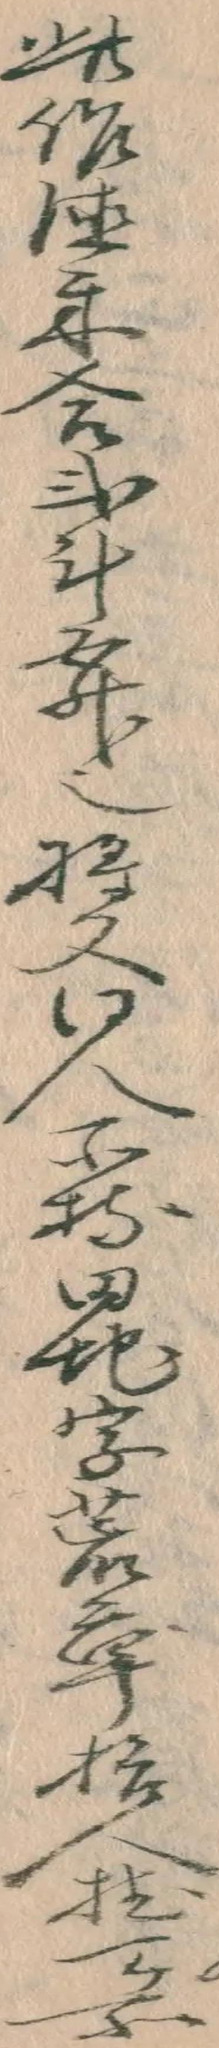此作徳来合弐斗五升也将又同人所持田地字荒章拾人植一ケ所
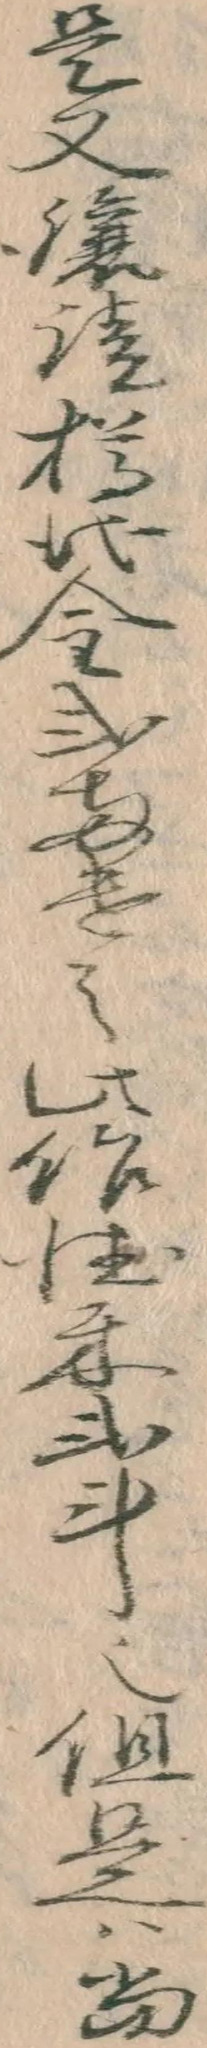是又譲請樽代金弐両遣之此作徳米弐斗也但是ハ當
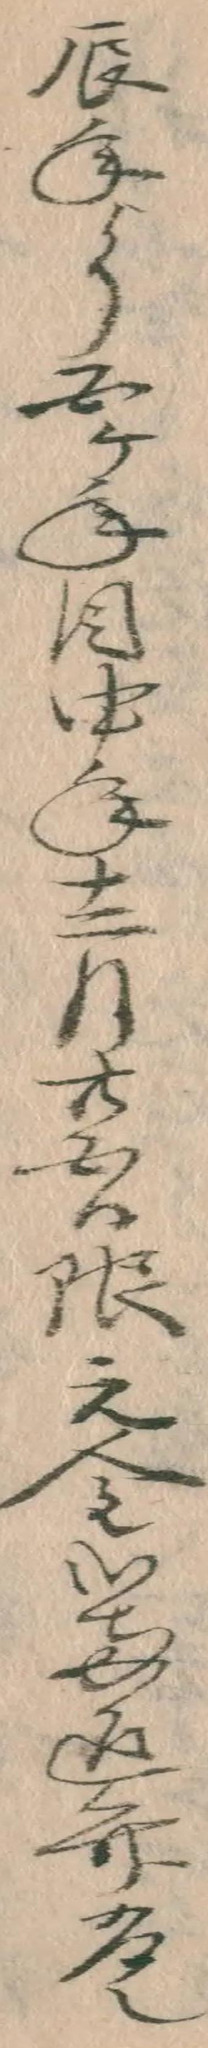辰年より五ヶ年目申年十二月廿五日限元金弐両返弁有之
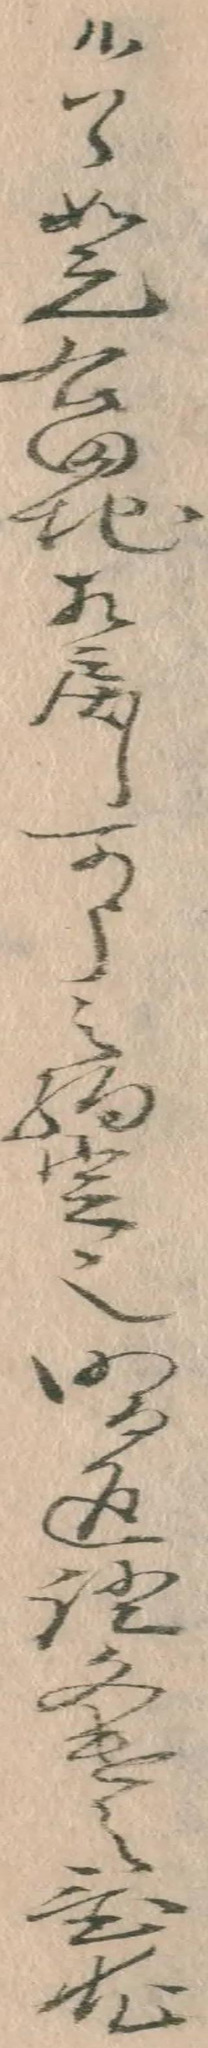候ハヽ如元右田地相戻し可申之約定也仍而返證文遣之置尤
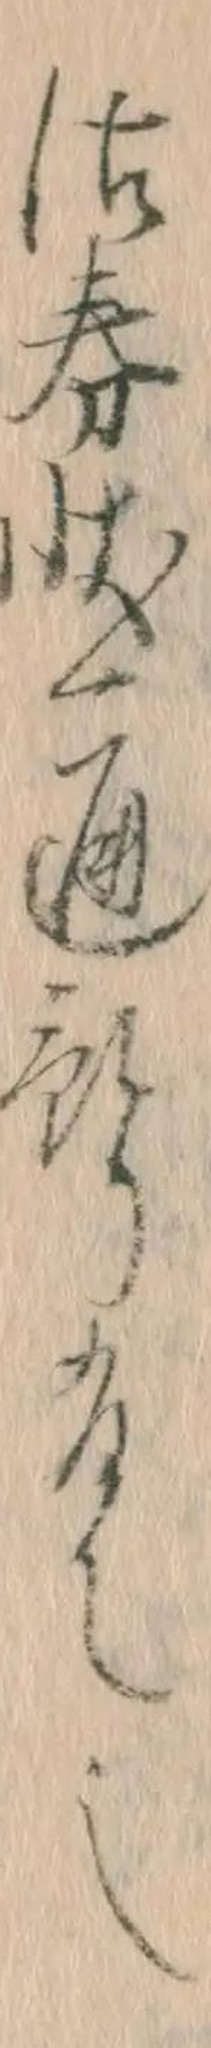沽券状一通預り有之也
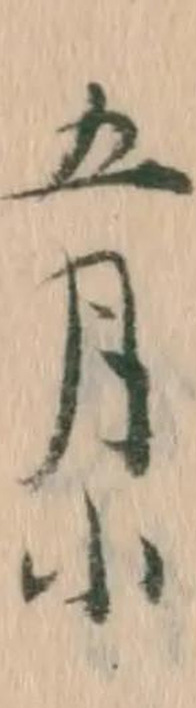五月小
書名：賀茂社記録. 第66冊
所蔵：国立国会図書館 National Diet Library, JAPAN
